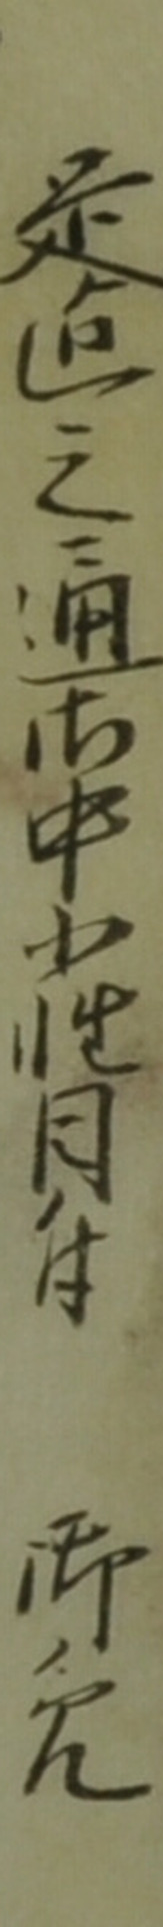是迄之通御中小性目付御免
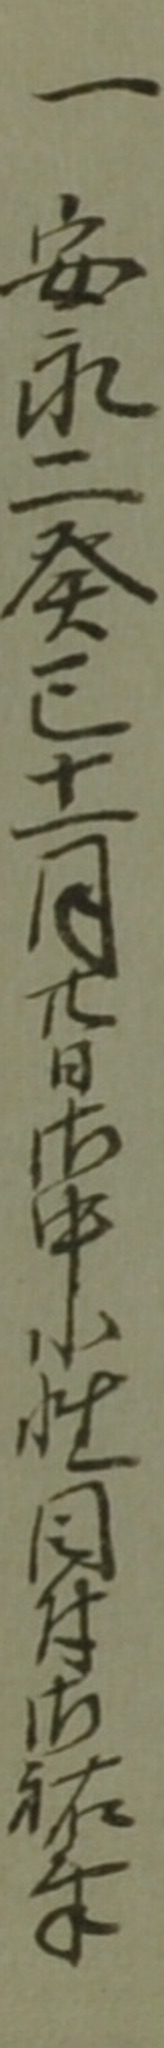一安永二癸巳十一月廿日御中小性目付御祐筆
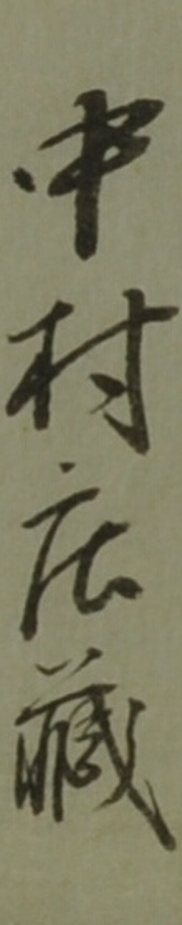中村庄蔵
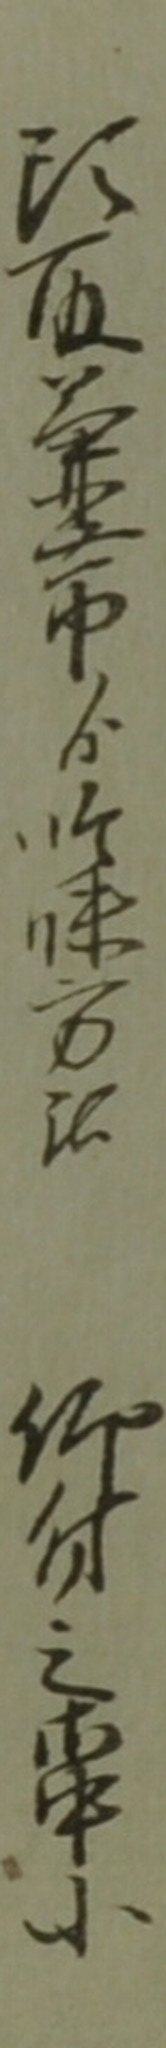頭取兼帯より吟味方被仰付之御中小
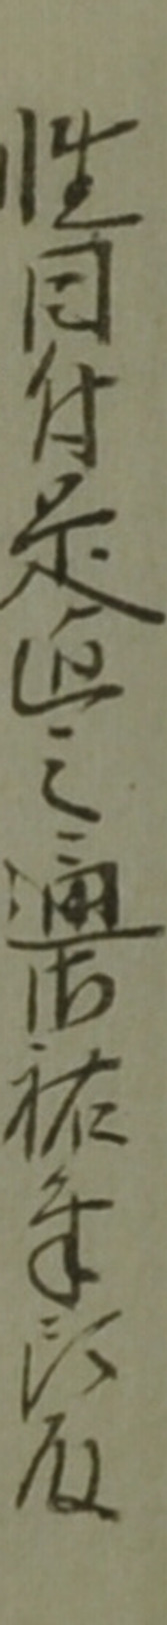性目付是迄之通御祐筆頭取
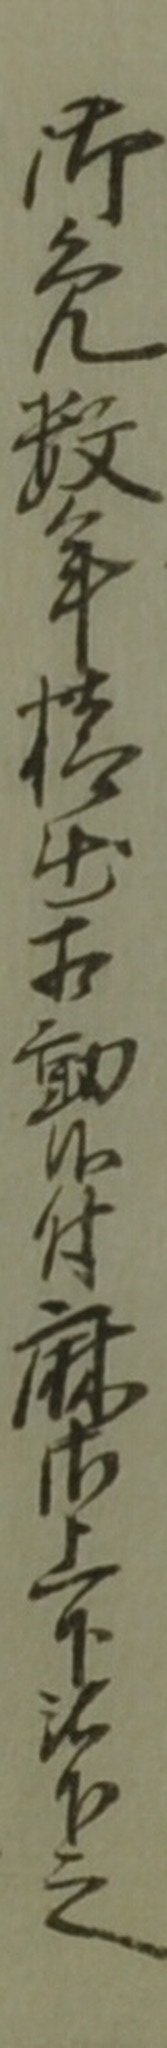御免数年精出相勤候付麻御上下被下之
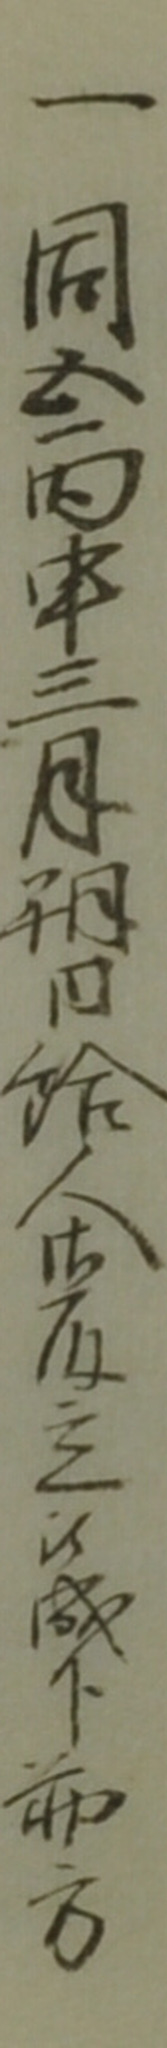一同五丙申三月朔日給人御取立被成下勤方
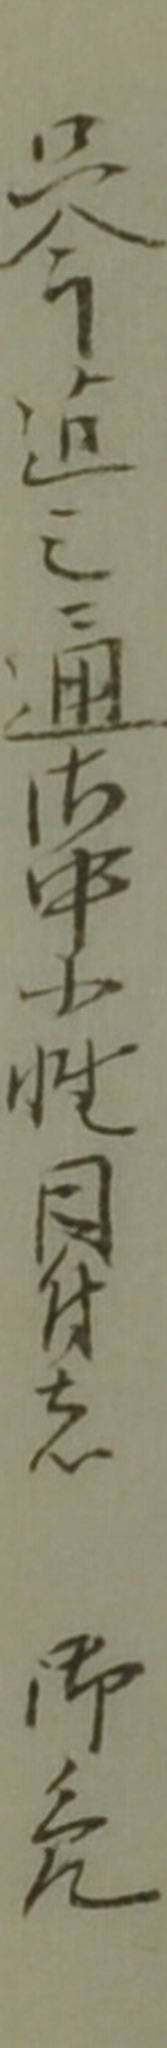只今迄之通御中小性目付者御免
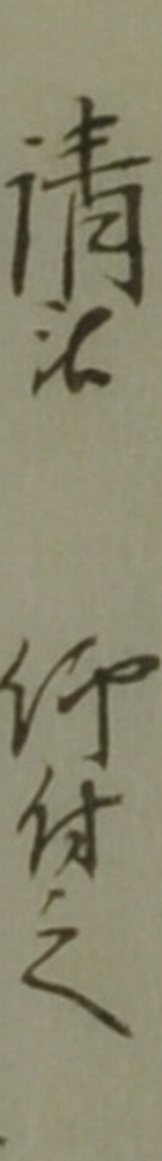請被仰付之
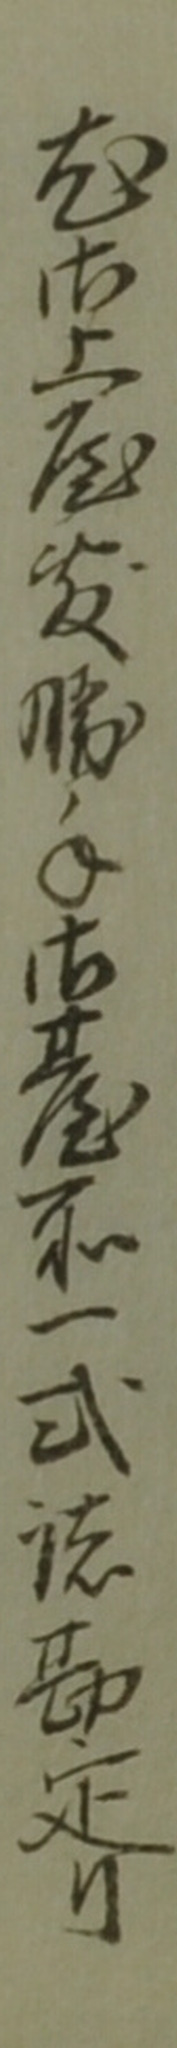尤御上屋敷勝手御臺所一式諸勘定引
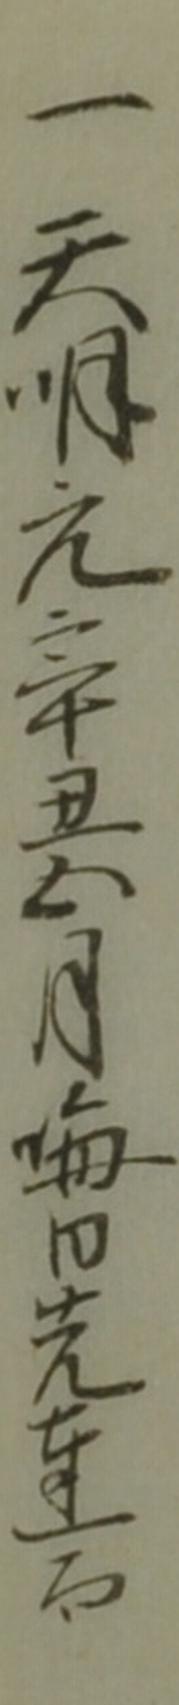一天明元辛丑五月給日先達而
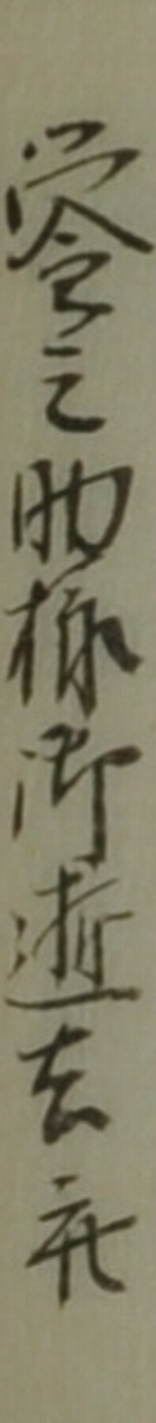金之助様御逝去并
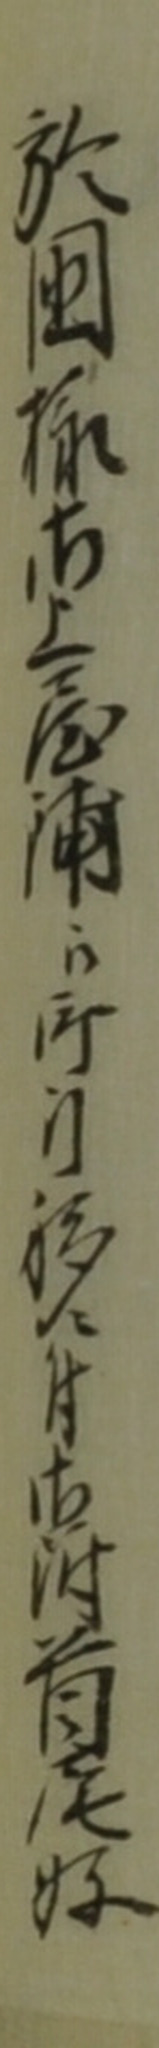於国様御上屋舗江御引移ニ付御附首尾好
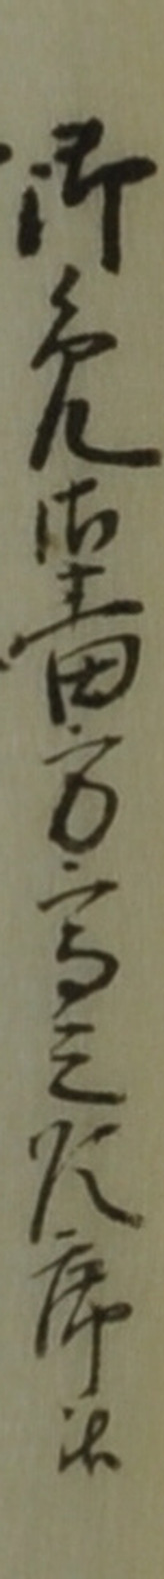御免御番方高之順席被
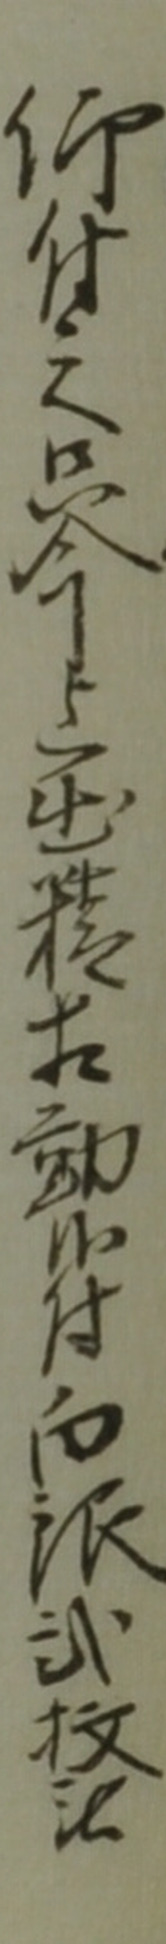仰付之只今迄出精相勤候付白銀弐枚被
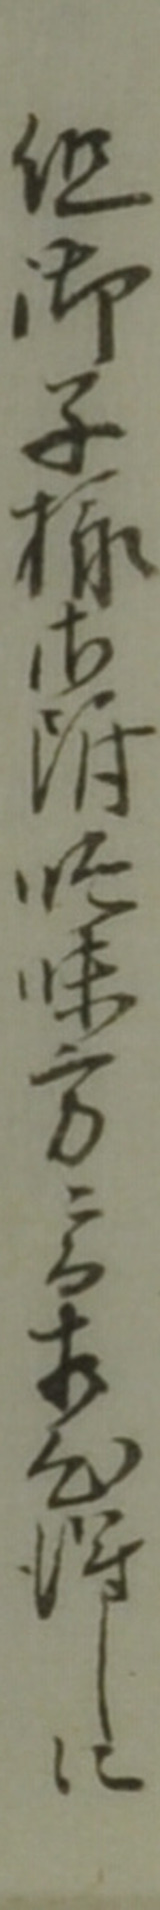但御子様御附吟味方にて相心得しに
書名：諸御役代々録（八）
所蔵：伊那市立高遠町図書館・合同会社AMANE
